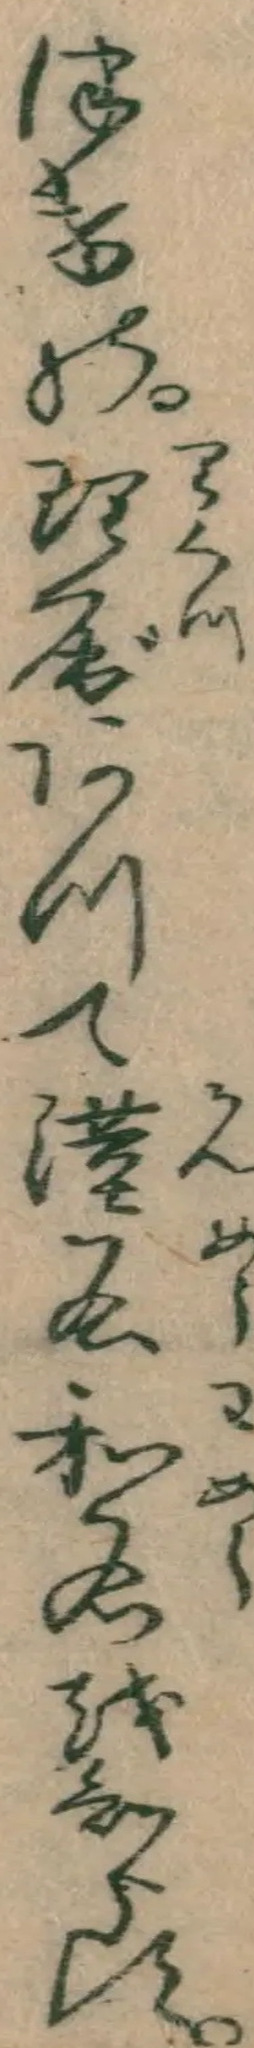つけの。理屈あつて漢名和名を知らす。
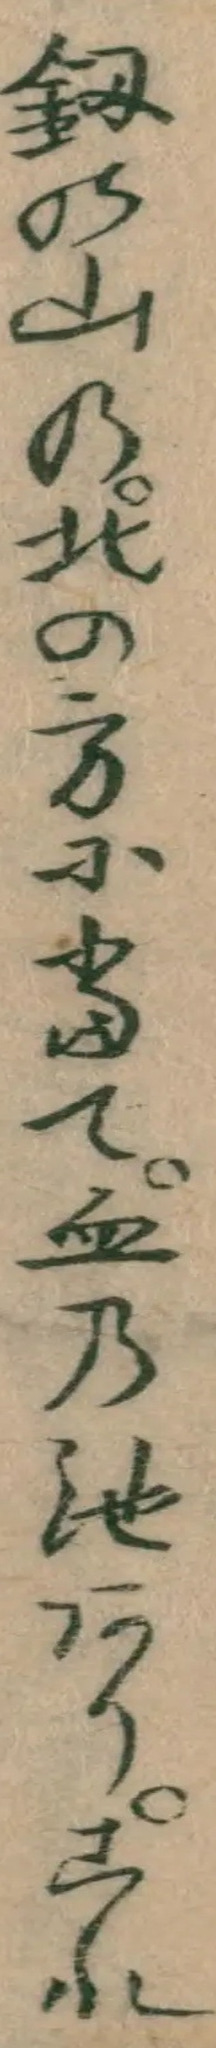剣の山の。北の方に当て。血の池あり。これ
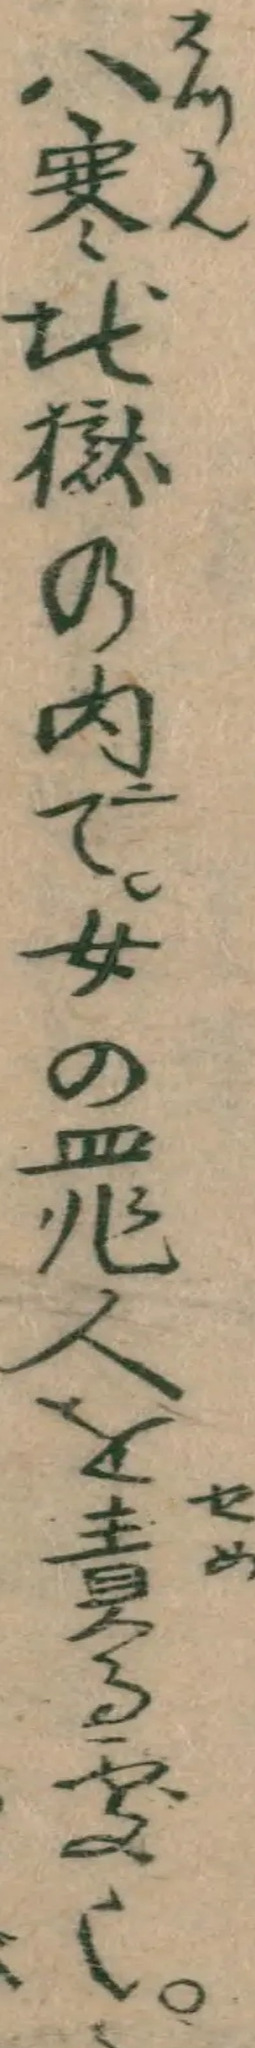八寒地獄の内にて。女の罪人を責る処也。
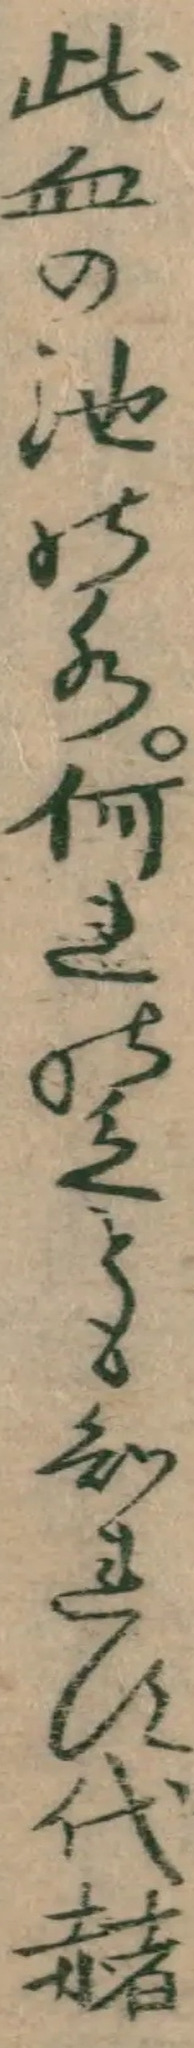此血の池の水。何れの色とも知れす代赭
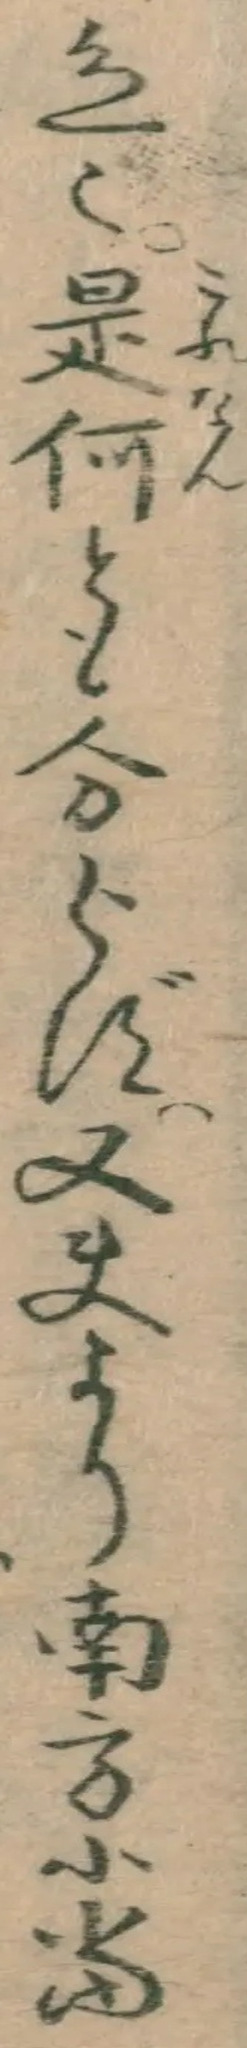色也。是何とも分らず。又夫より南方に当
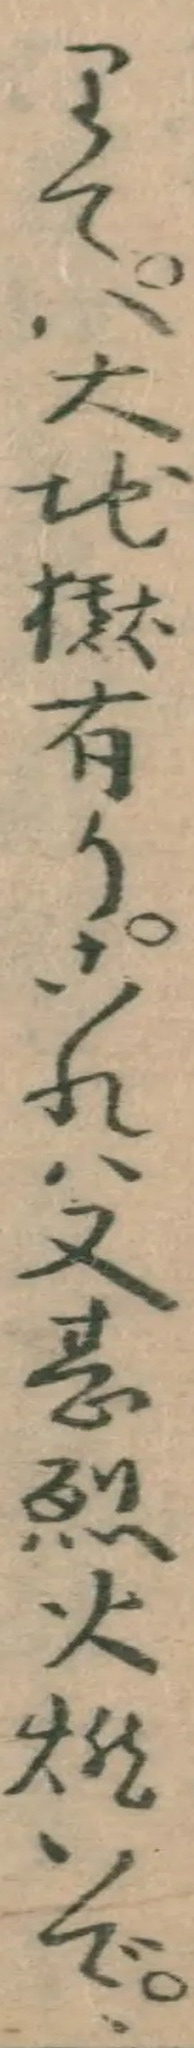りて。八大地獄有り。これは又甚烈火燃いで。
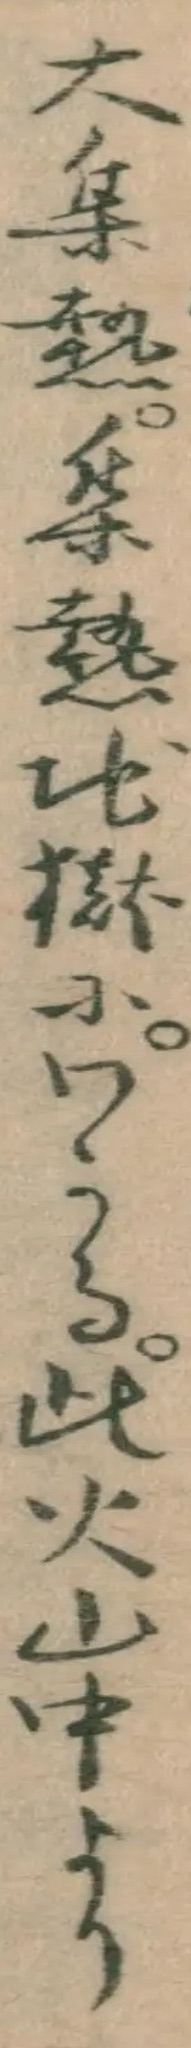大集熱。集熱地獄に。わかる。此火山中より
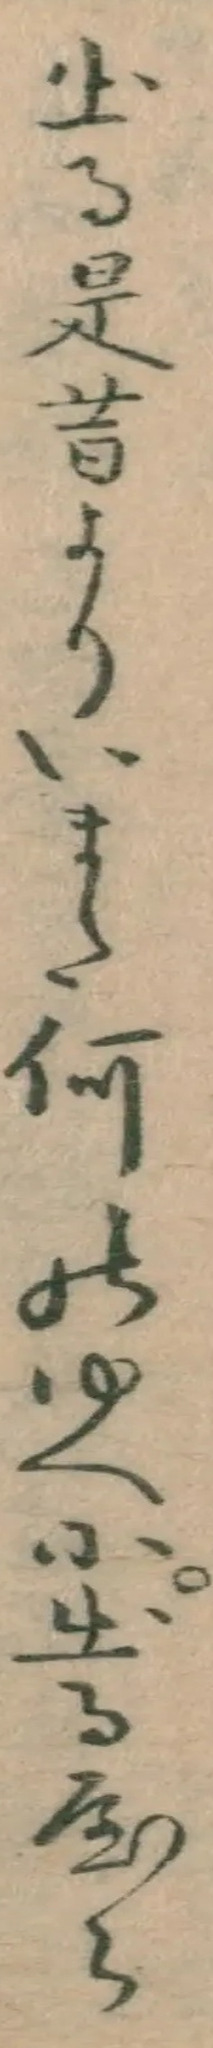出る是昔よりいまた何のゆへに。出るやら
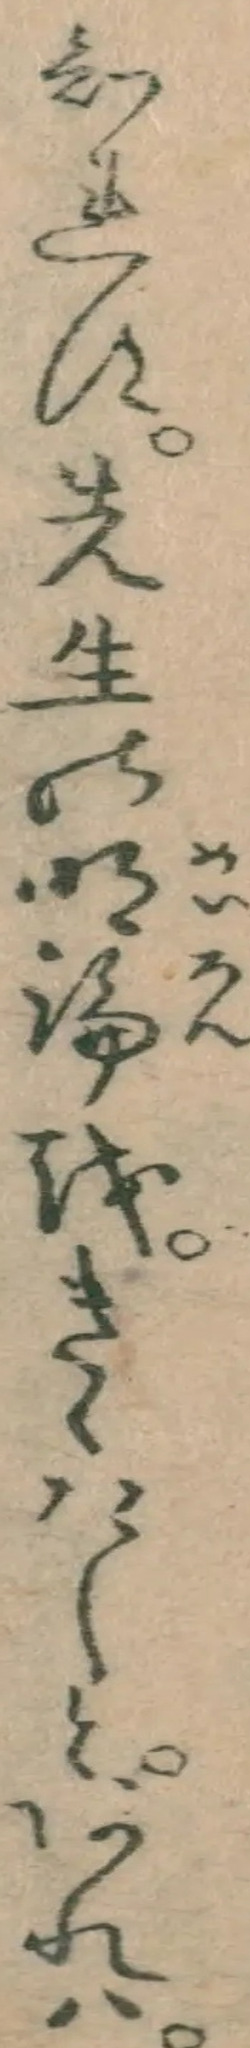知れす。先生の明論を。きゝたしと。あれは。
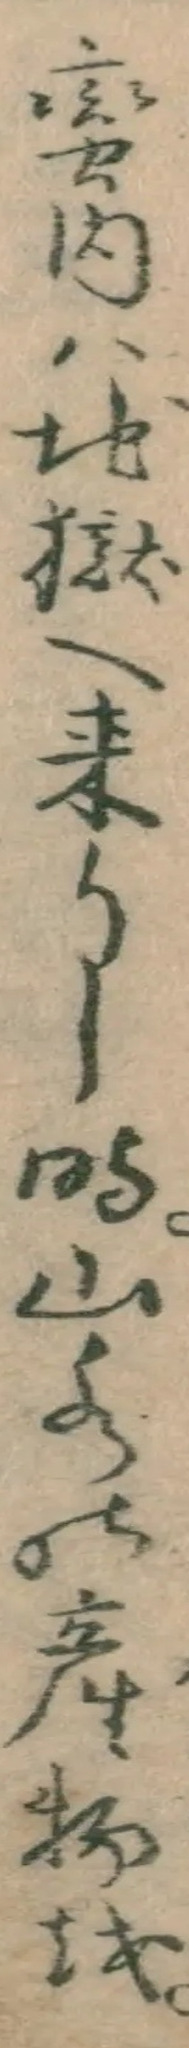蛮内は地獄へ来りし時。山よりの産物を。
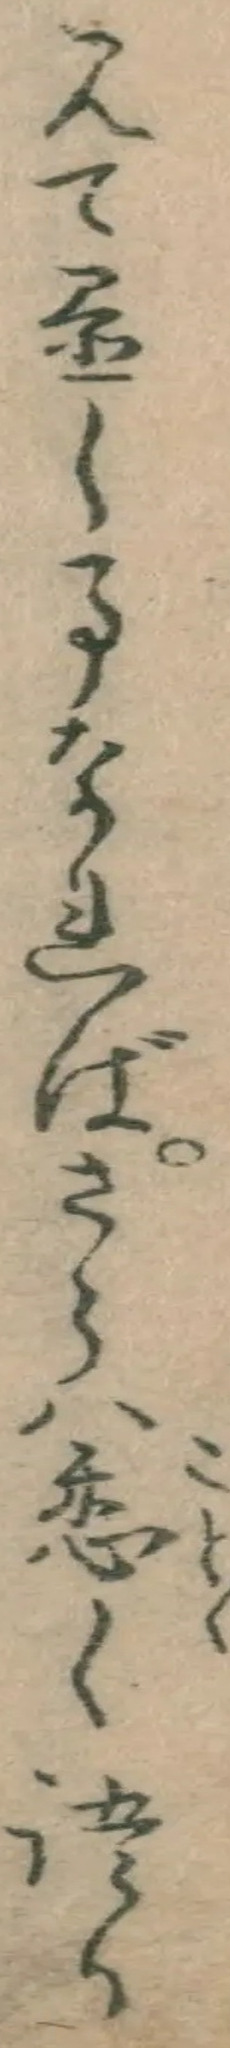見て置し事なれば。さらは悉〳〵し語り
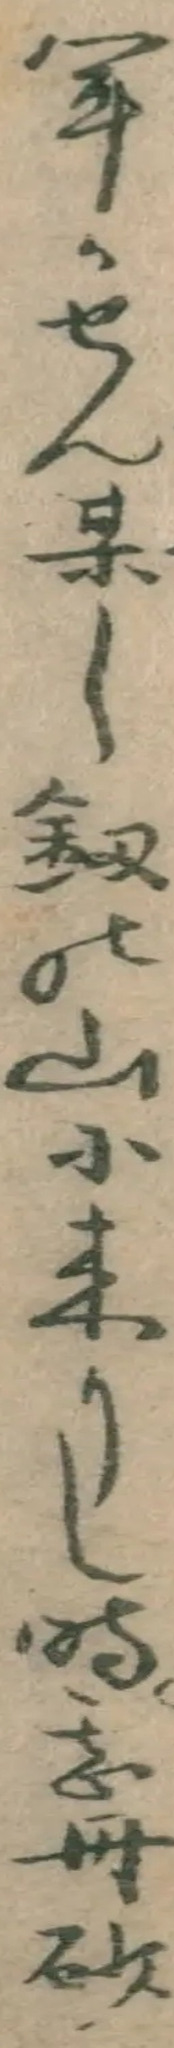聞かせん。某し剣の山に来りし時。甚丹砂

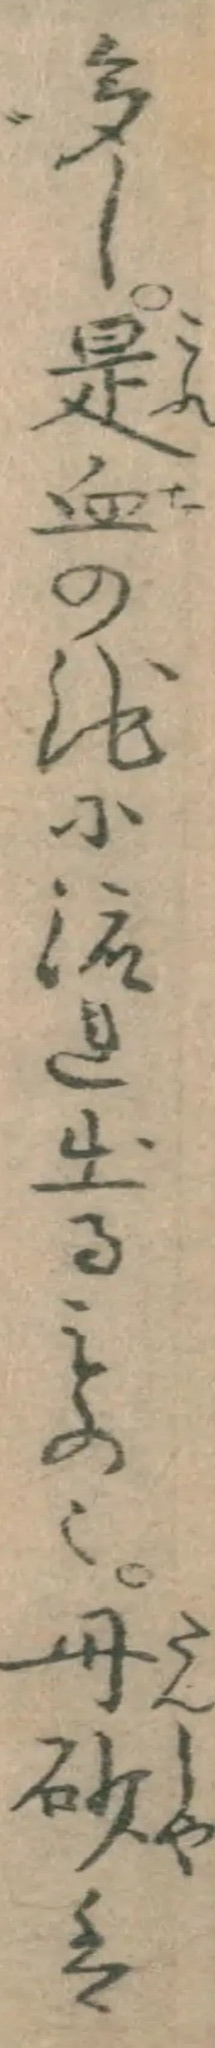多し。是血の池に流れ出るもの也。丹砂は
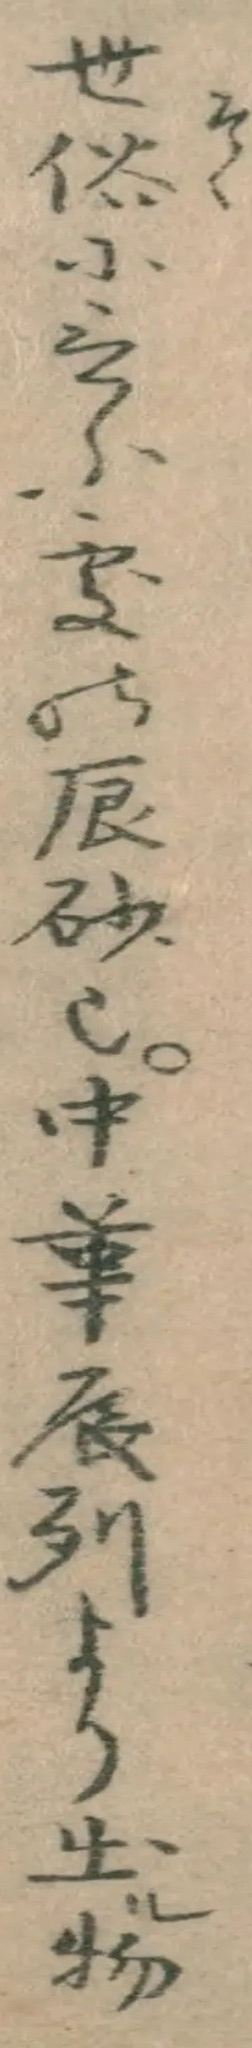世俗に言ふ処の辰砂也。中華辰列より出物
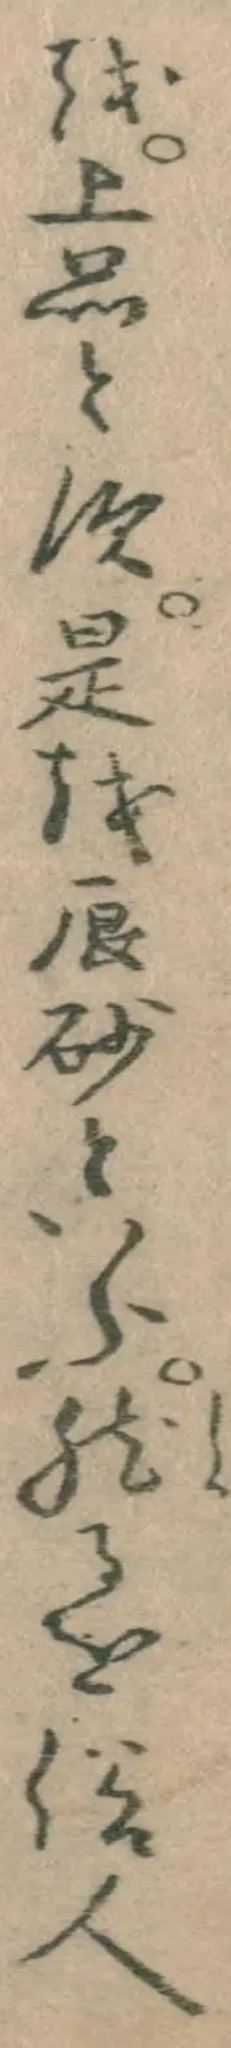を。上品とす。是を辰砂といふ。然るを俗人
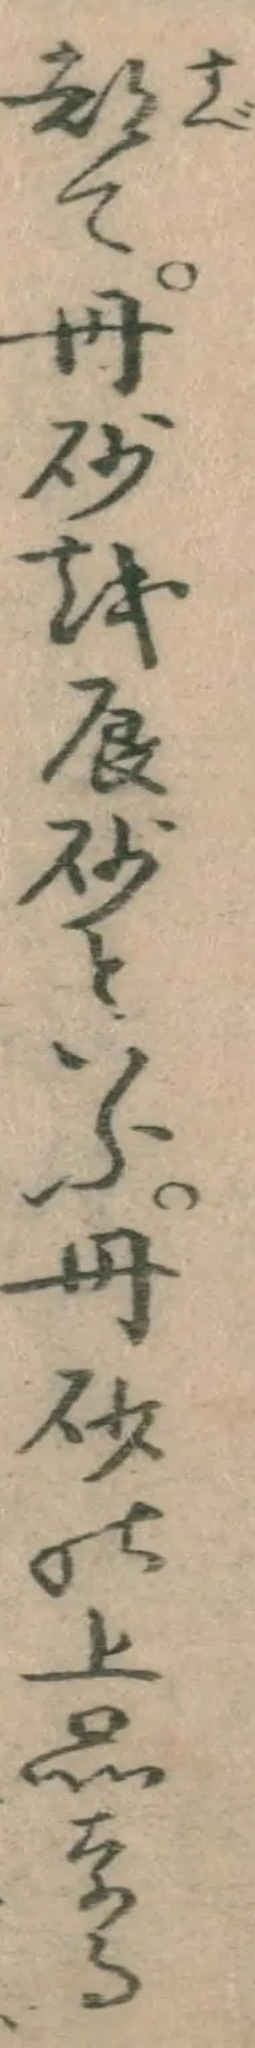都て。丹砂を辰砂といふ。丹砂の上品なる
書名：翻草盲目
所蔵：国立国会図書館 National Diet Library, JAPAN
